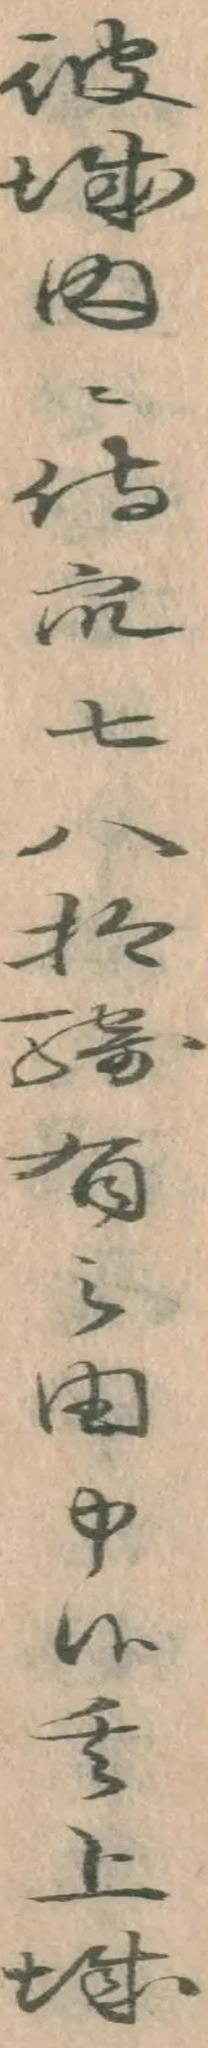彼城内に侍衆七八拾騎有之由申候其上城
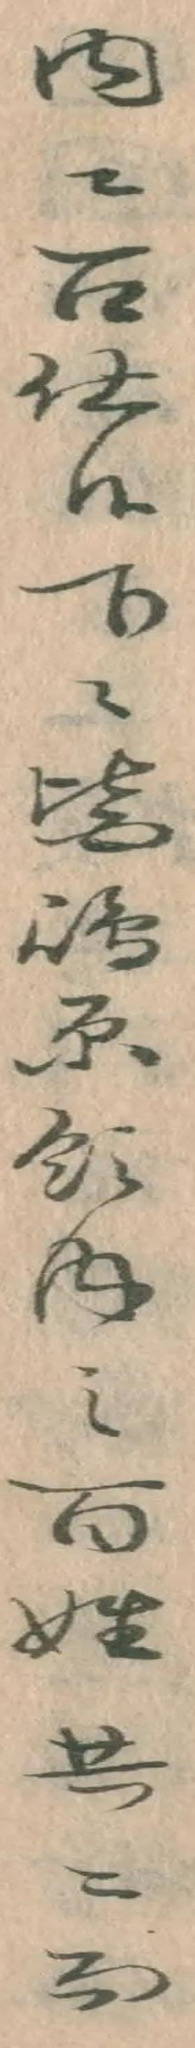内に召仕候下々皆島原領内之百姓共に而
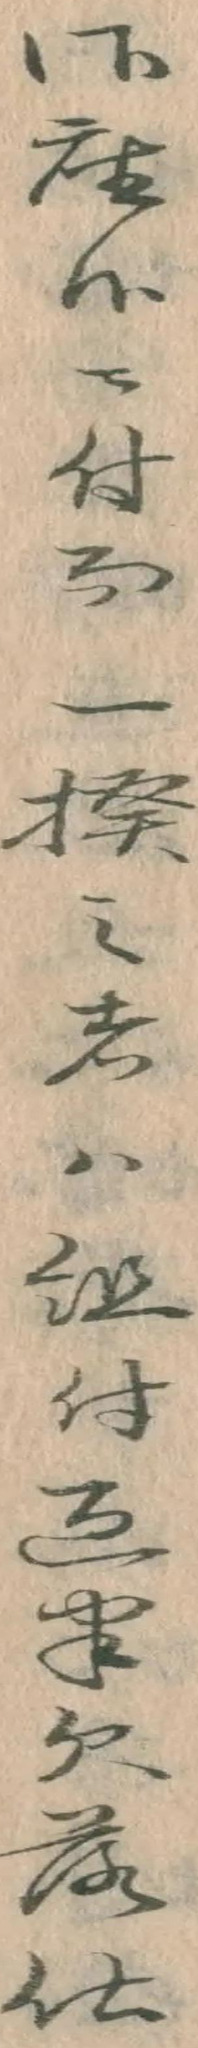御座候に付而一揆之者は組付過半欠洛仕
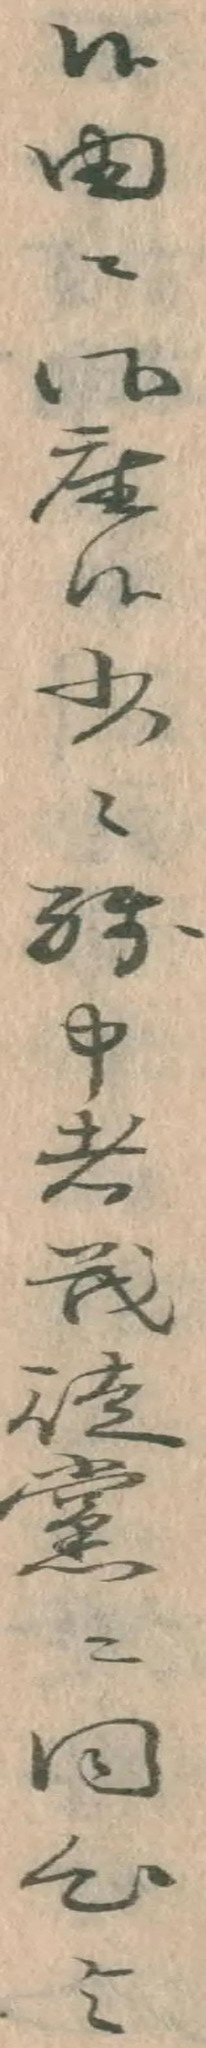候由に御座候少々残申者茂徒党に同心与
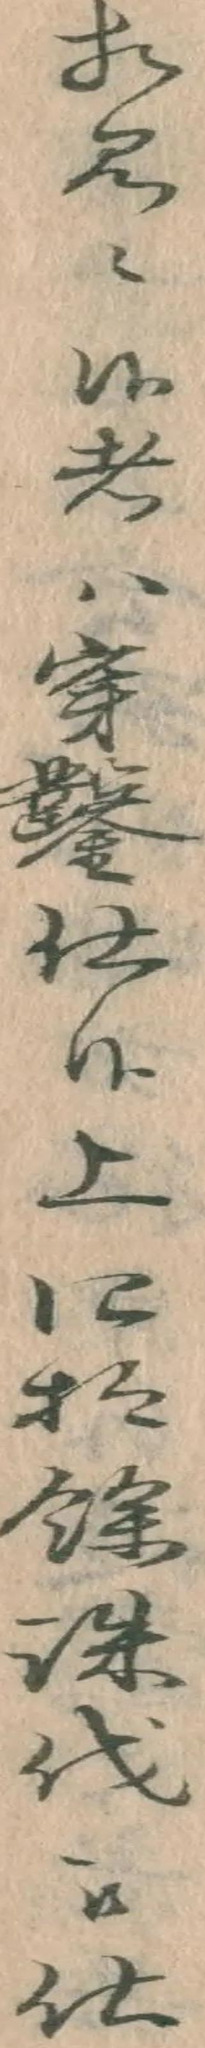相見に候者は穿鑿仕候上四拾余誅伐被仕
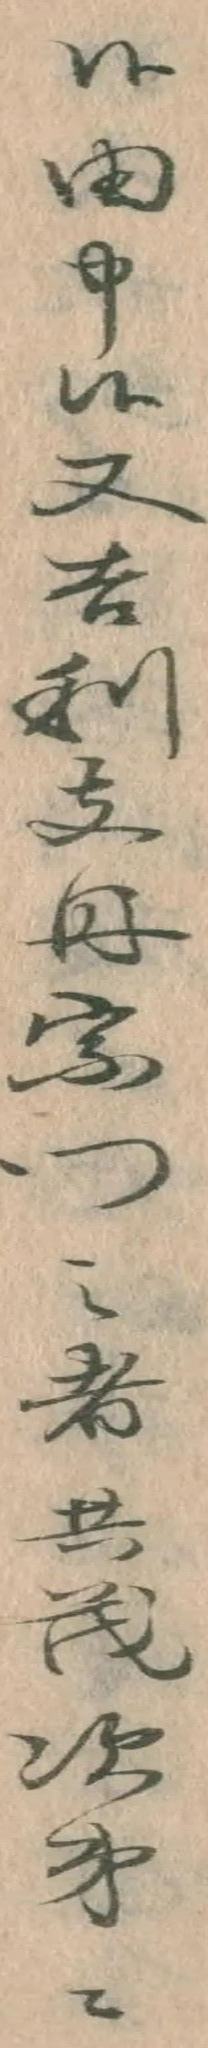候由申候又吉利支丹宗門之者共茂次第に
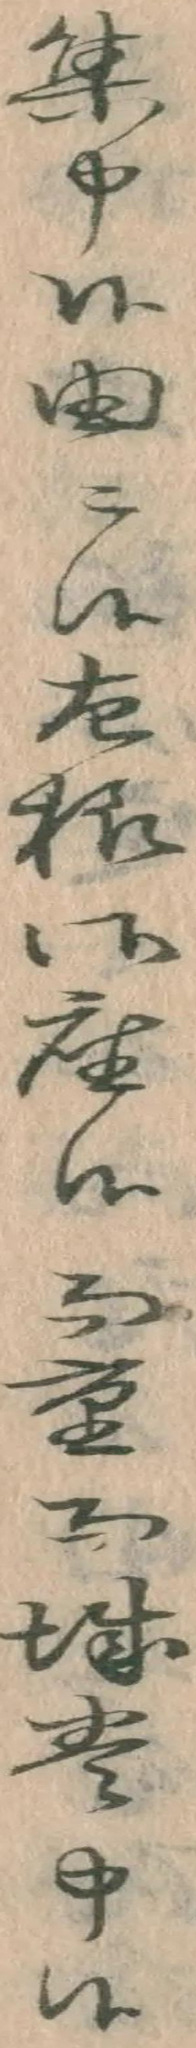集申候由に候左様御座候而重而城巻申候
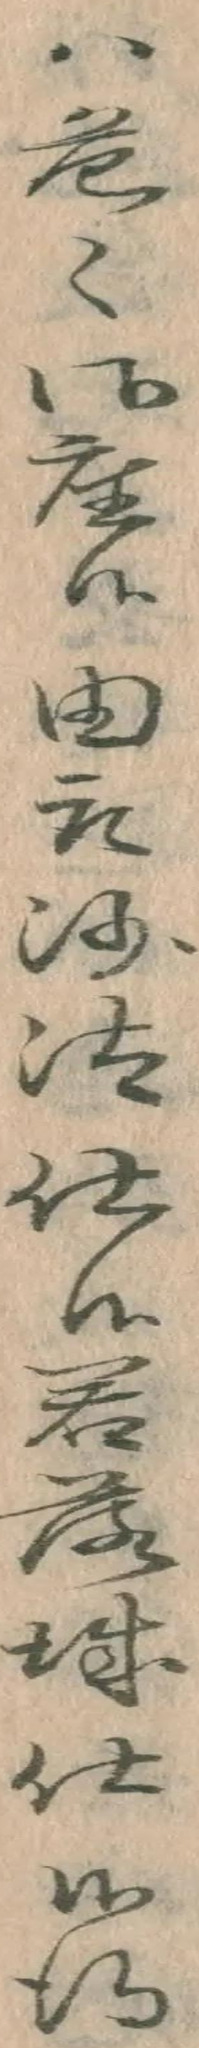は危く御座候由取沙汰仕候若落城仕候得
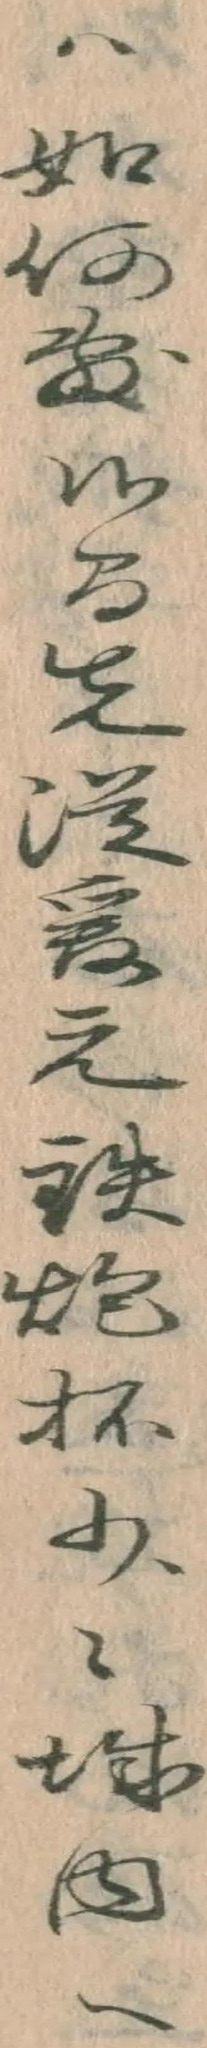は如何敷候間先従爰元鉄炮抔少々城内へ
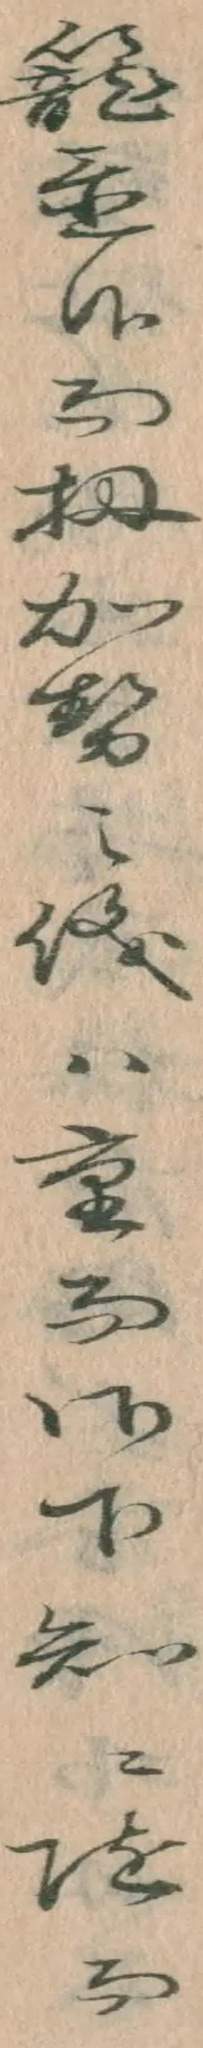籠置候而扨加勢之儀は重而御下知に随而
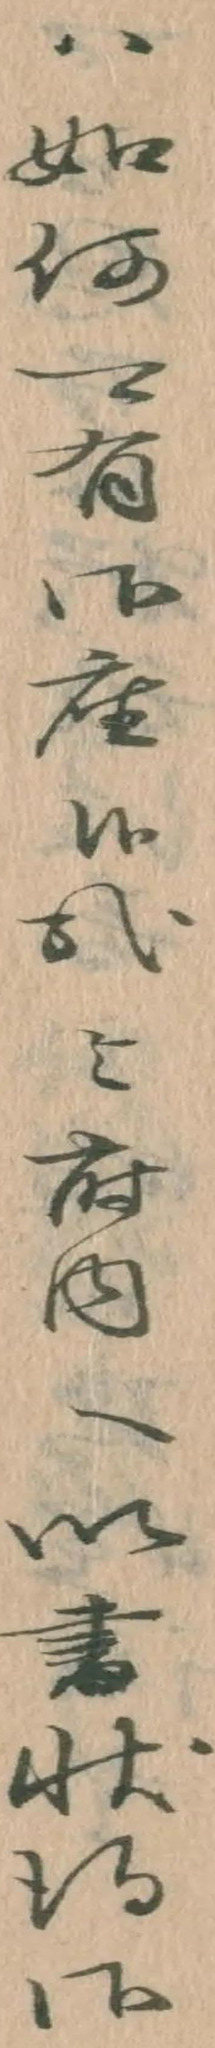は如何可有御座候哉と府内へ以書状得御
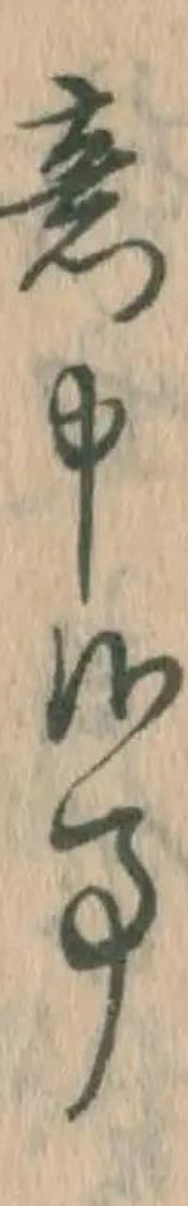意申候事
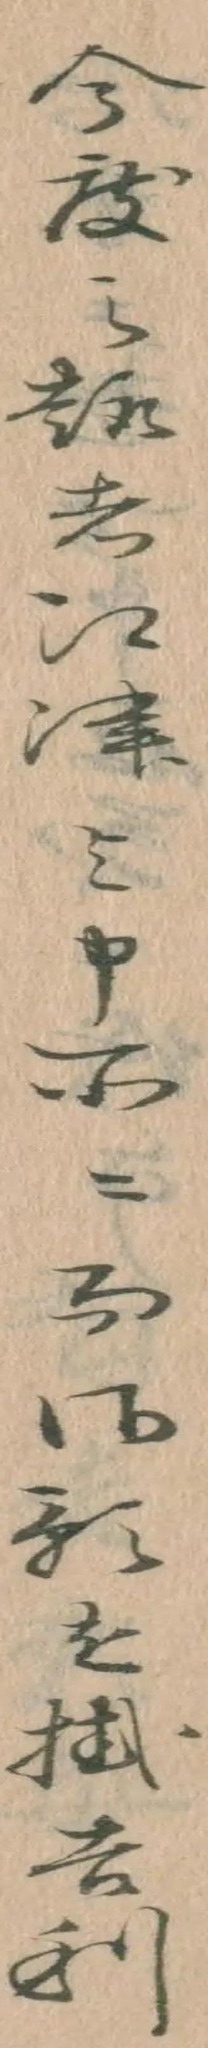一今度之趣者江津与申所に而御願を掛吉利
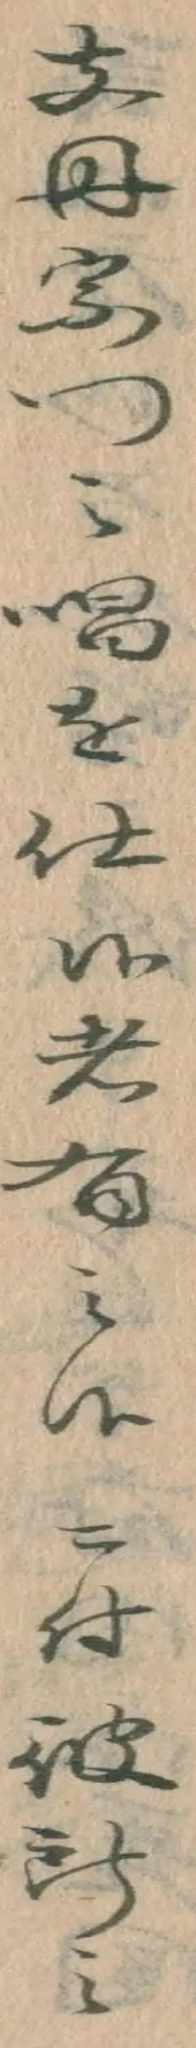支丹宗門之唱を仕候者有之候に付彼所之
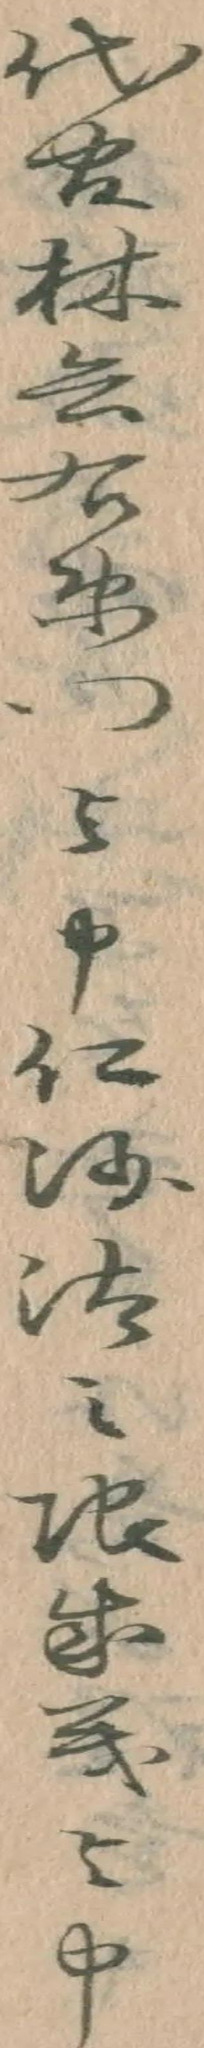代官林兵右衛門与申仁沙汰之限成義与申
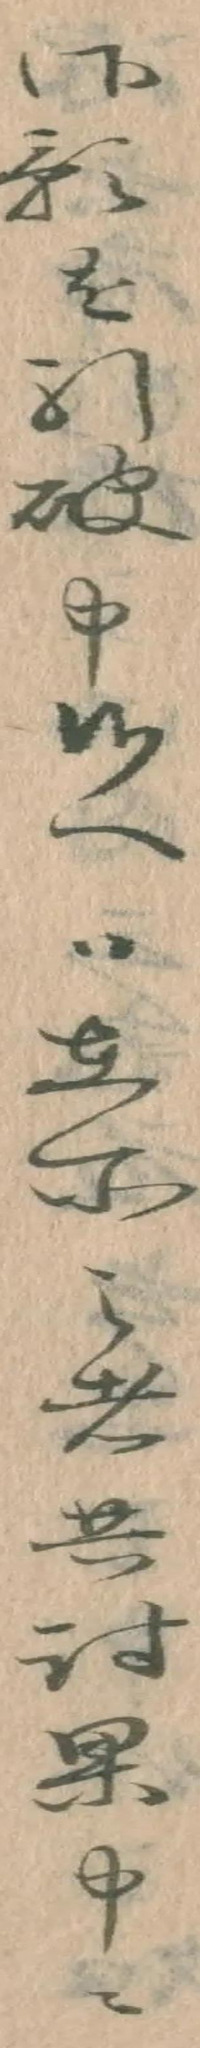御願を引破申候へは在所之者共討果申に
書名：切支丹御退治記 49巻. [2]
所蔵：国立国会図書館 National Diet Library, JAPAN
